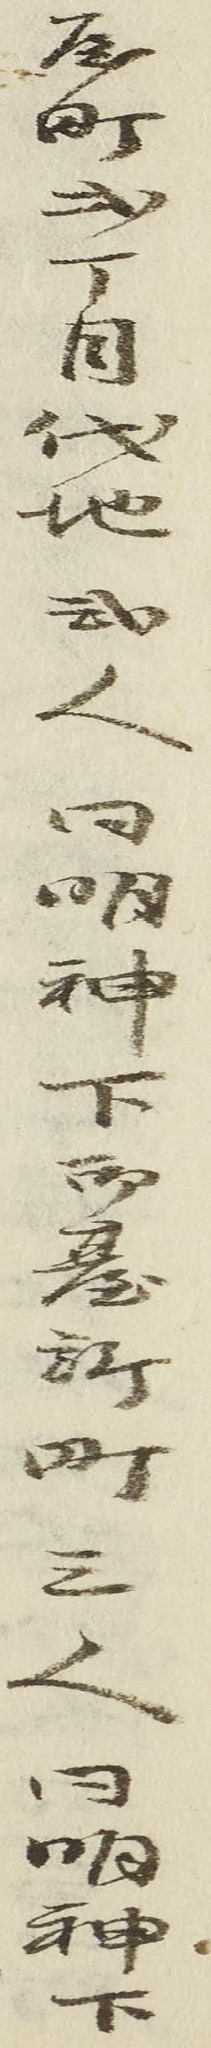屋町弐丁目代地弐人同明神下御台所町三人同明神下
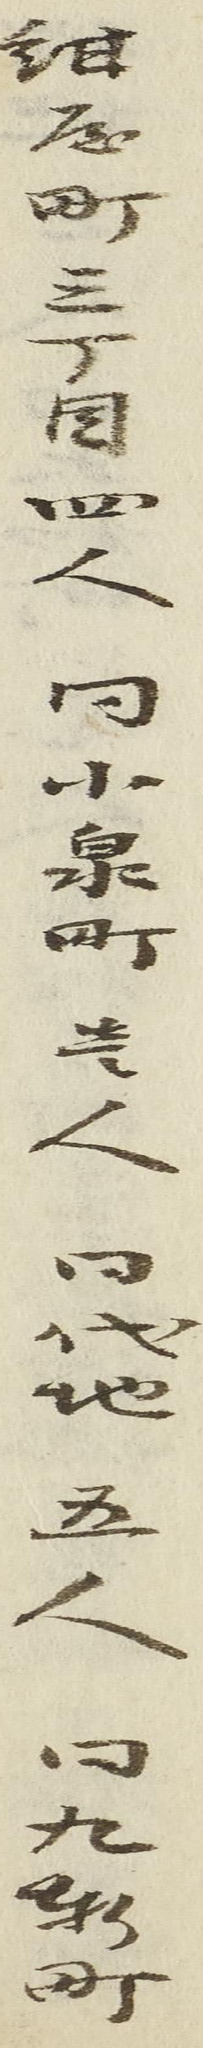紺屋町三丁目四人同小泉丁壱人同代地五人同九軒町

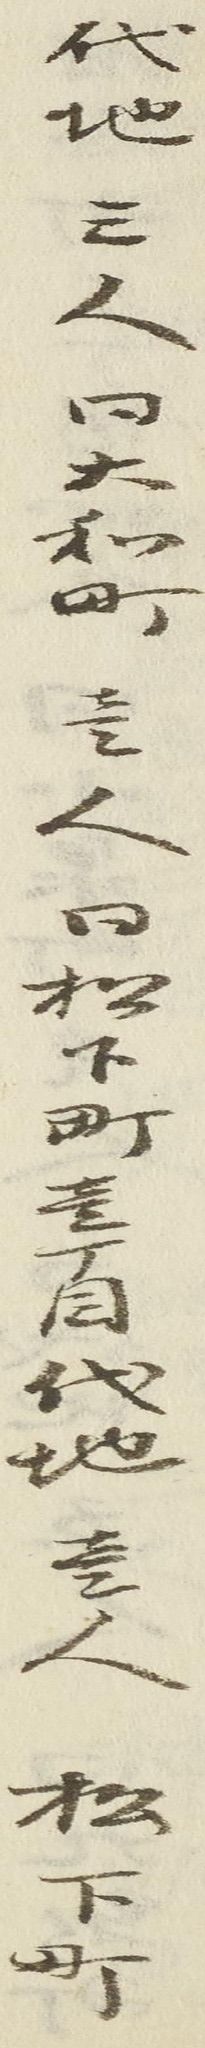代地三人同大和町壱人同松下町壱丁目代地壱人松下町
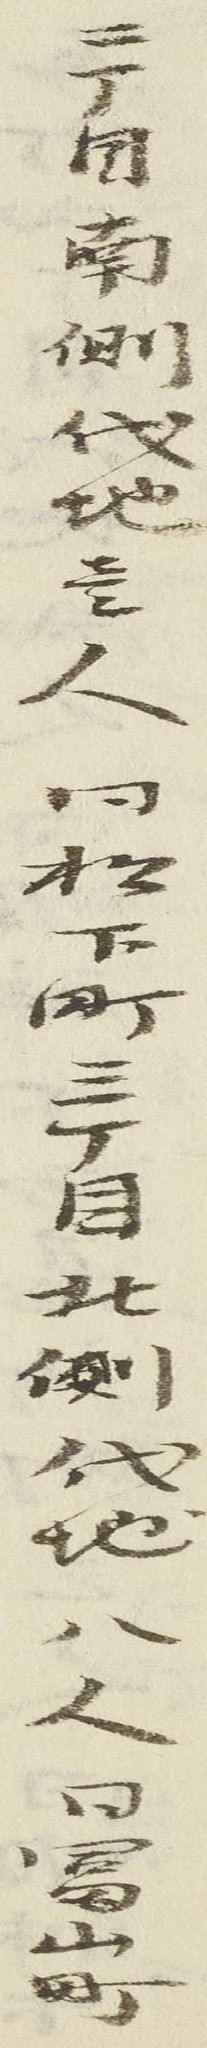二丁目南側代地壱人同松下町三丁目北側代地八人同富山町
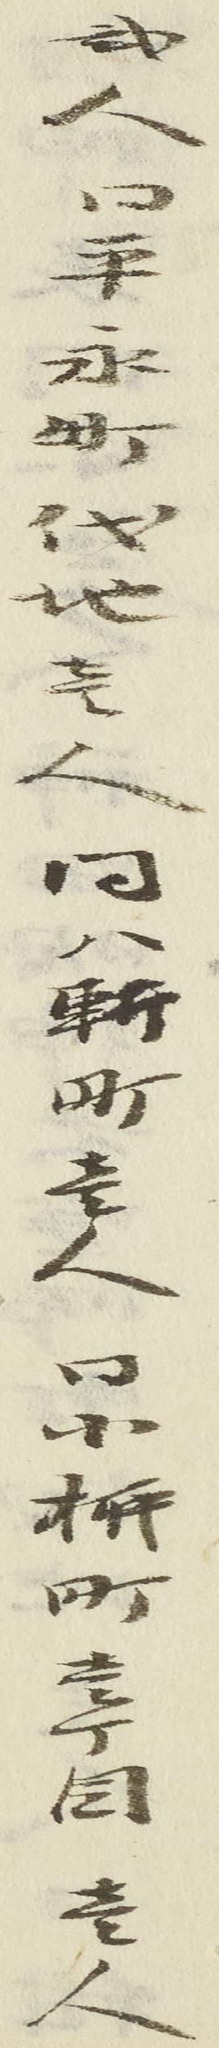弐人同平永町代地壱人同八軒町壱人同小柳町壱丁目壱人
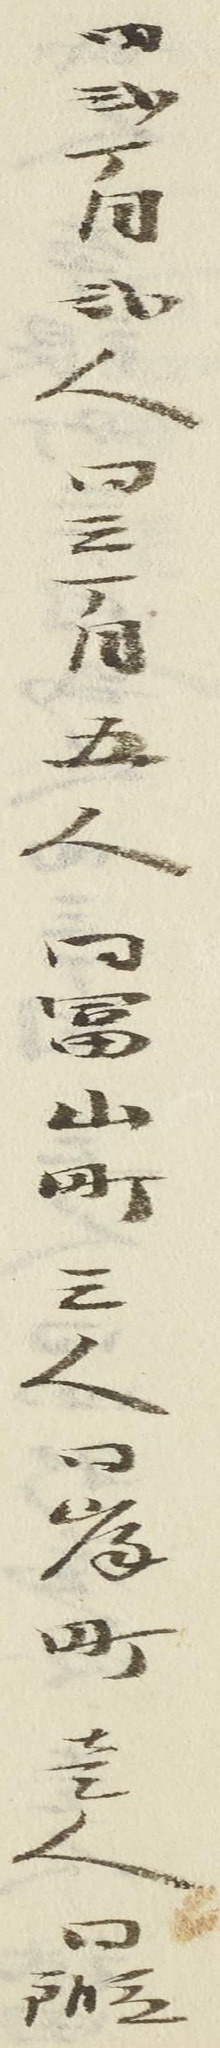同弐丁目弐人同三丁目五人同富山町三人同岸町壱人同鍛
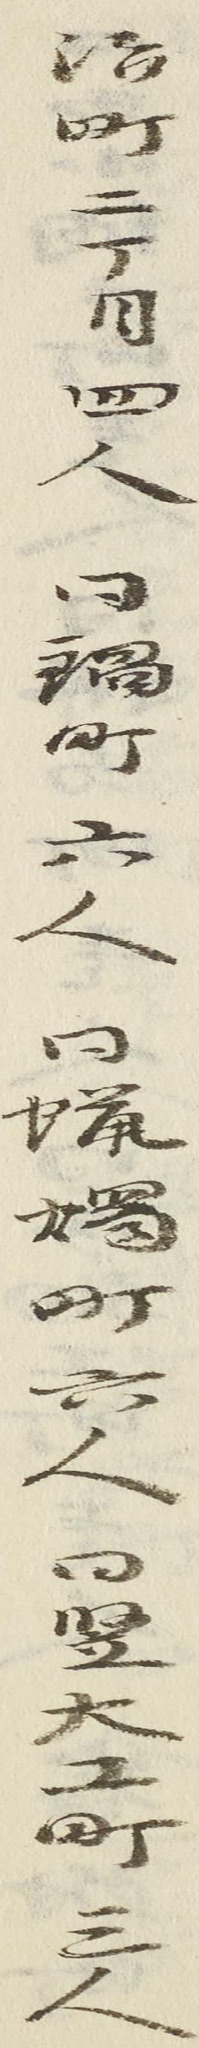治町二丁目四人同鍋町六人同蝋燭町六人同竪大工町三人
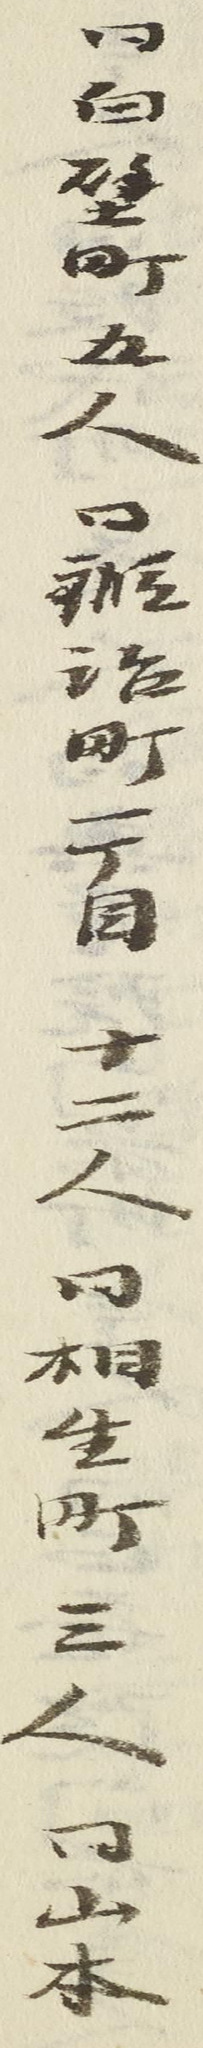同白壁町五人同鍛治町一丁目十二人同相生町三人同山本
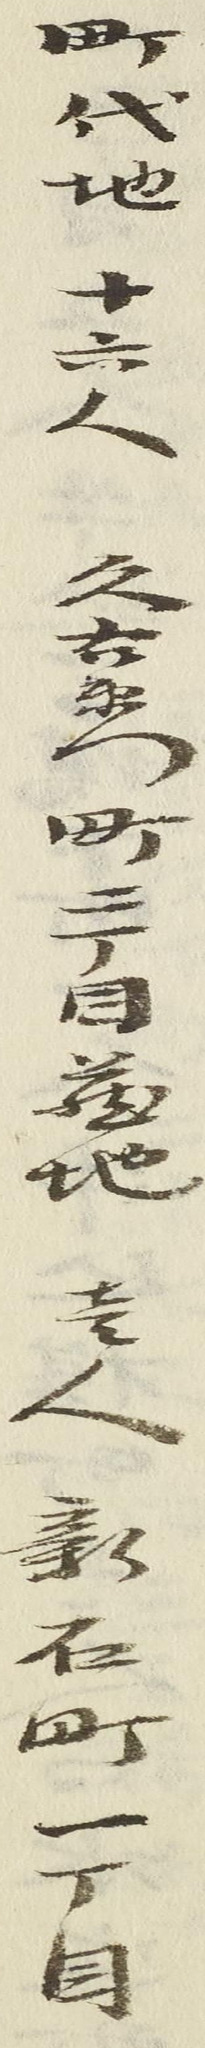町代地十六人久右衛門町二丁目蔵地壱人新石町一丁目
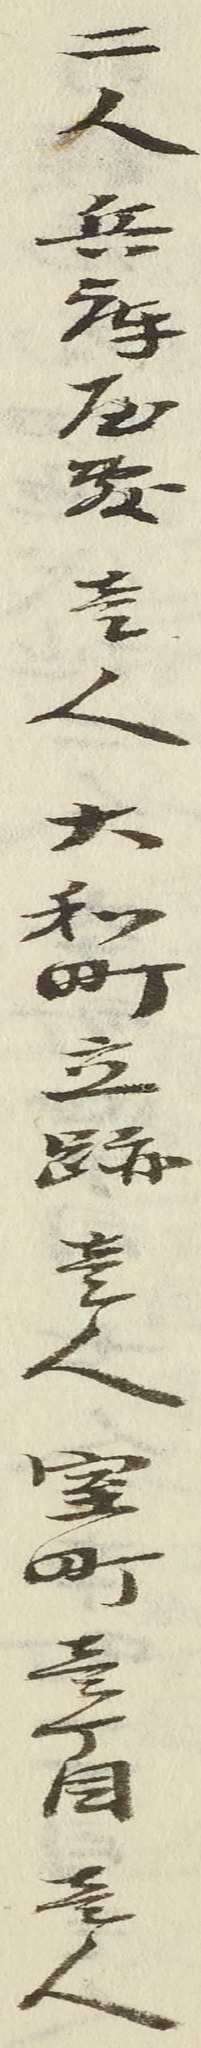二人兵庫屋敷壱人大和町立跡壱人室町壱丁目壱人
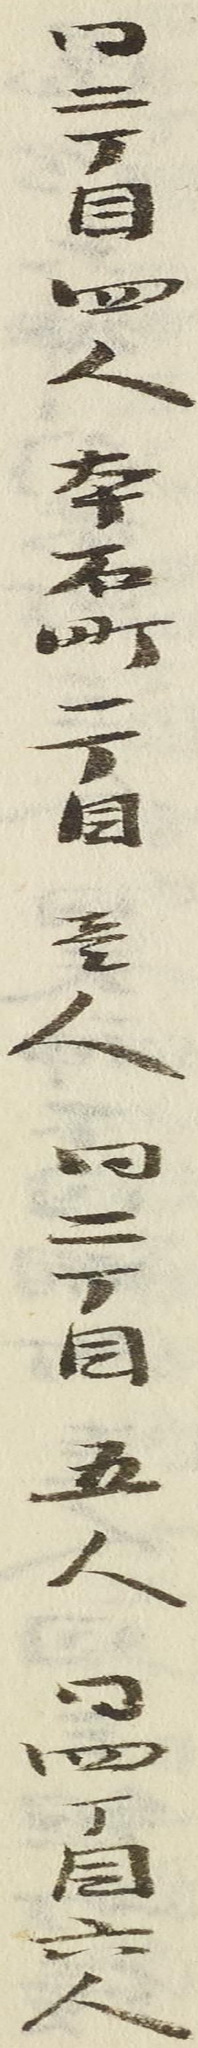同二丁目四人本石町一丁目壱人同二丁目五人同四丁目六人
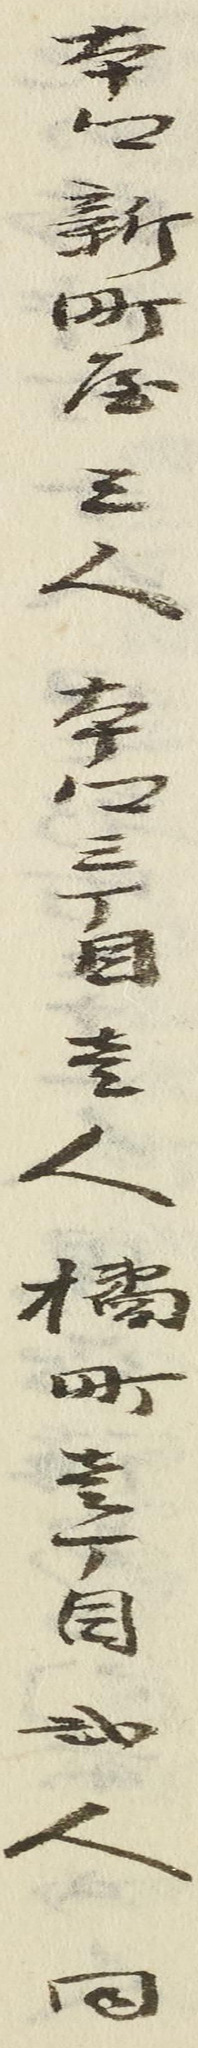本郷新町屋三人本郷三丁目壱人橘町壱丁目弐人同
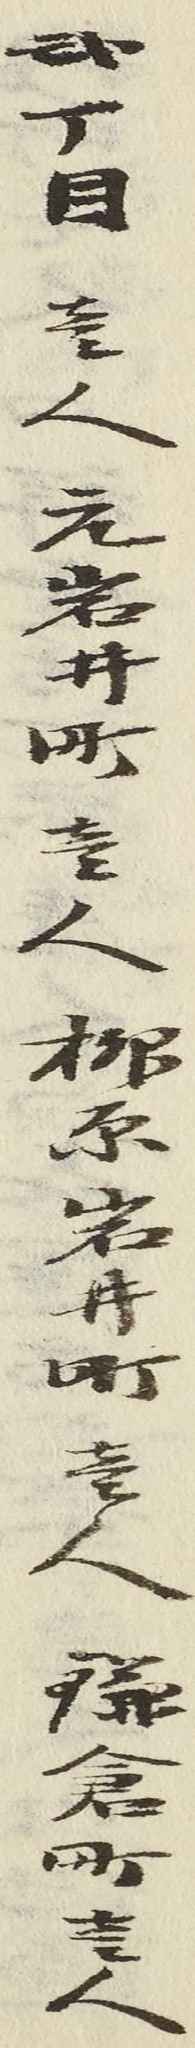弐丁目壱人元岩井町壱人柳原岩井町壱人鎌倉町壱人
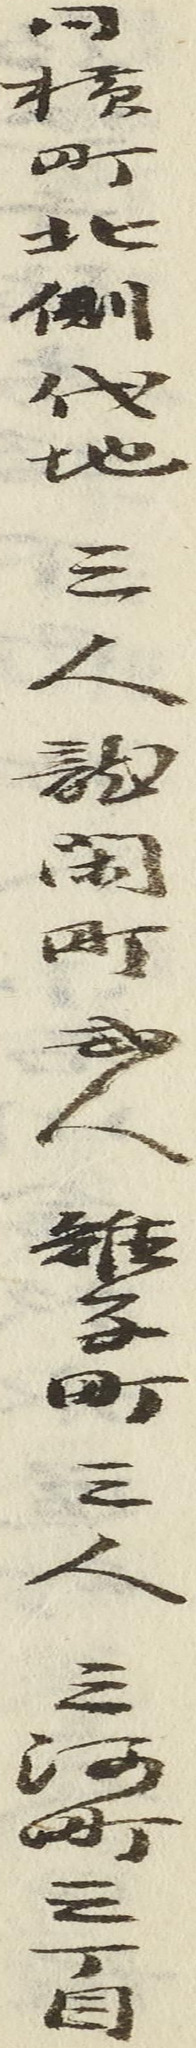同横町北側代地三人龍閑町弐人雉子町三人三河町三丁目
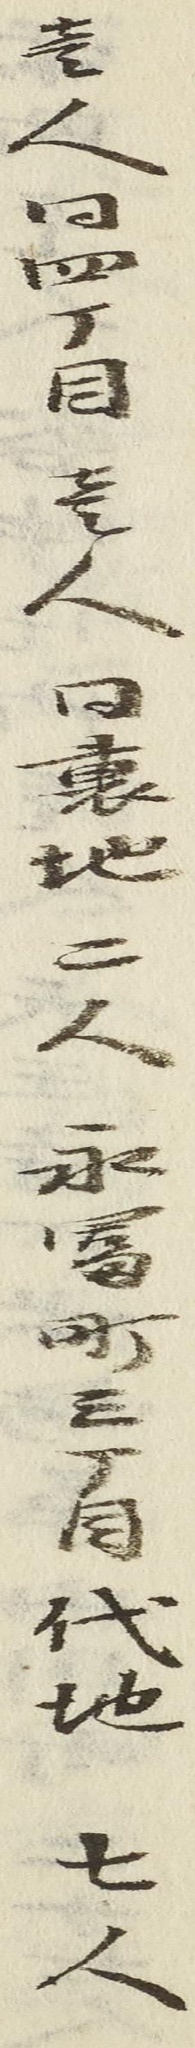壱人同四丁目壱人同裏地二人永富町三丁目代地七人
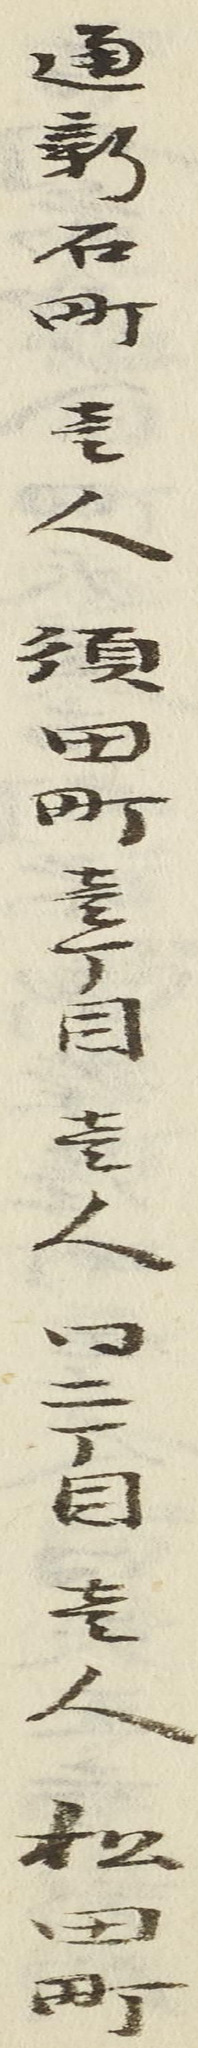通新石町壱人須田町壱丁目壱人同二丁目壱人松田町
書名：那為の後見艸　全
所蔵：東京大学地震研究所図書室 Earthquake Research Institute Library, The University of Tokyo, JAPAN
